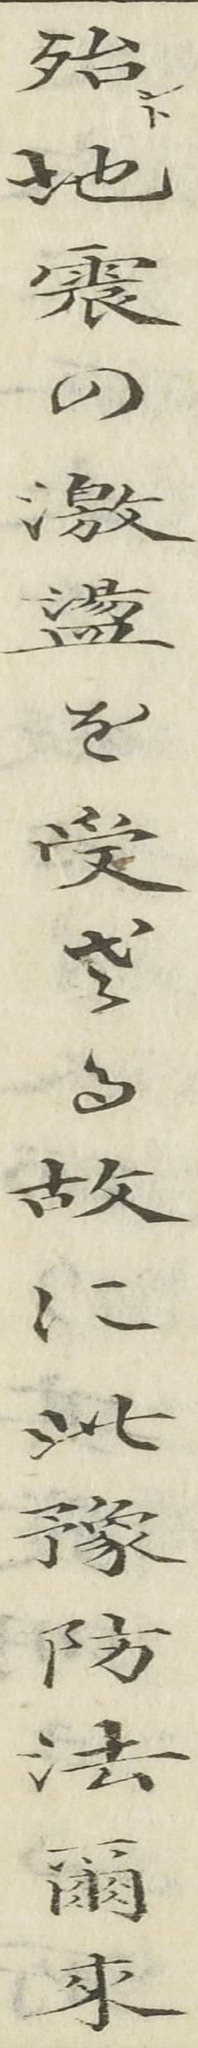殆地震の激盪を受ける故に此予防法爾来
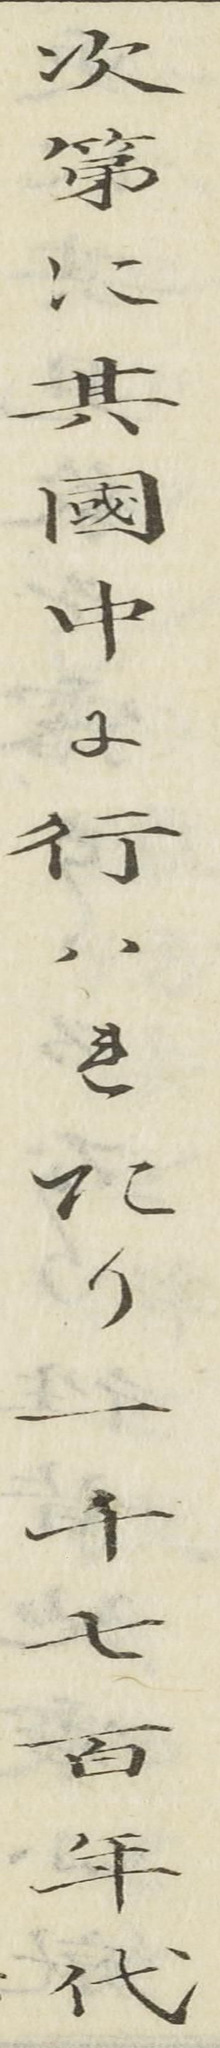次第に其国中に行はれたり一千七百年代
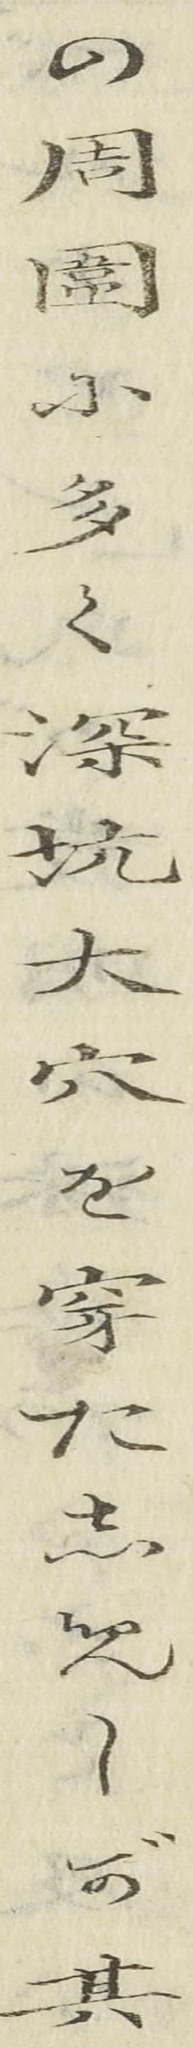の周囲に多く深坑大穴を穿たしめしが其
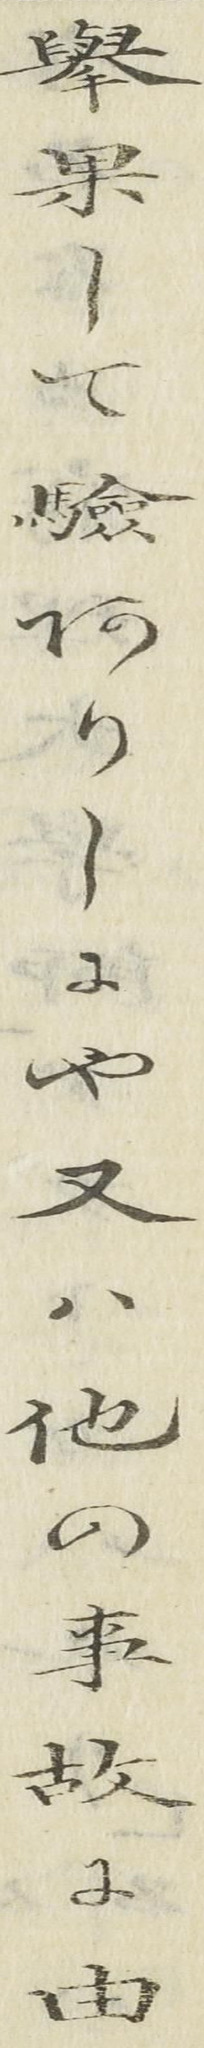挙果して験ありしにや又は他の事故に由
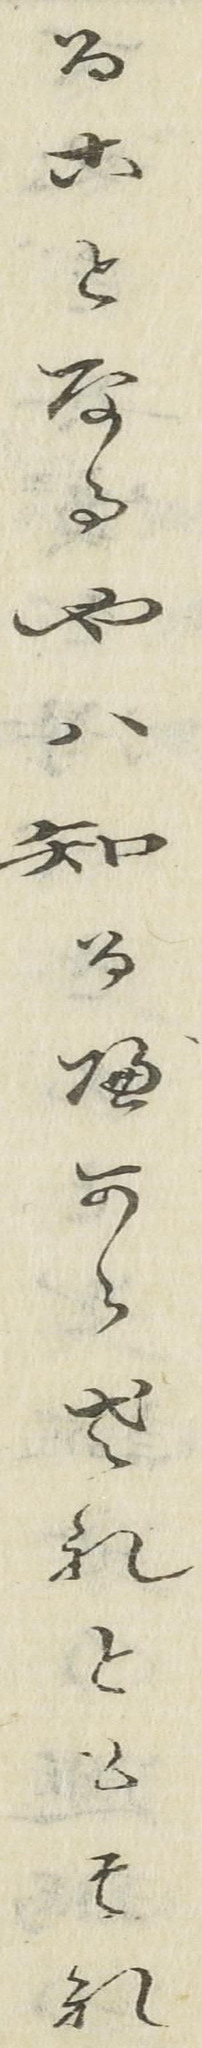ることなるやは知るべからされともそれ
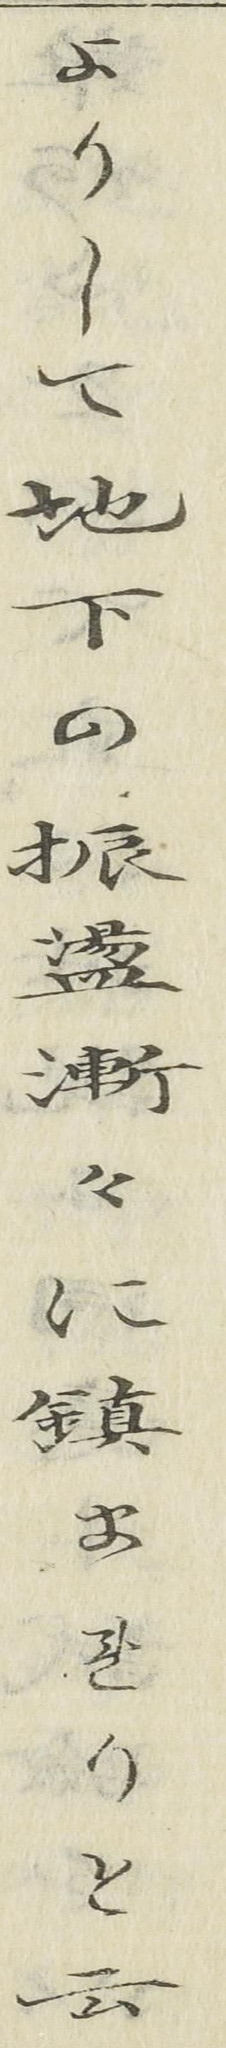よりして地下の振盪漸々に鎮まれりと云
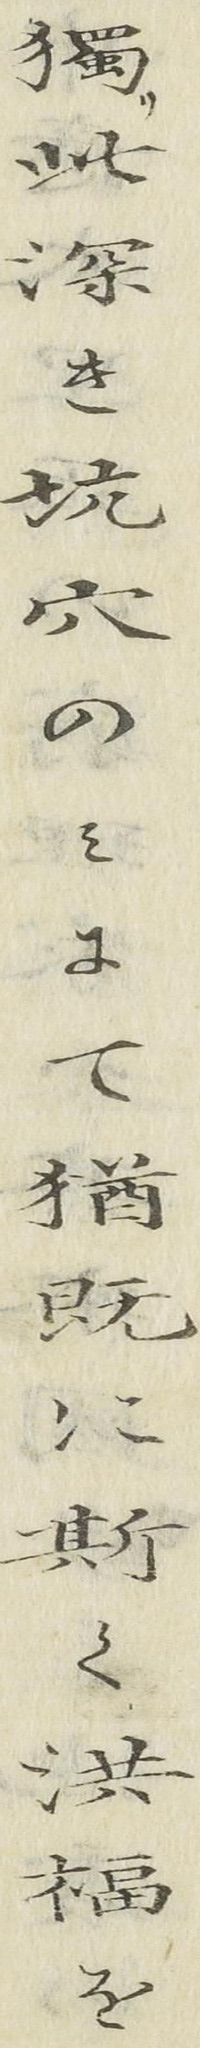独此深き坑穴のみにて猶既に斯く洪福を
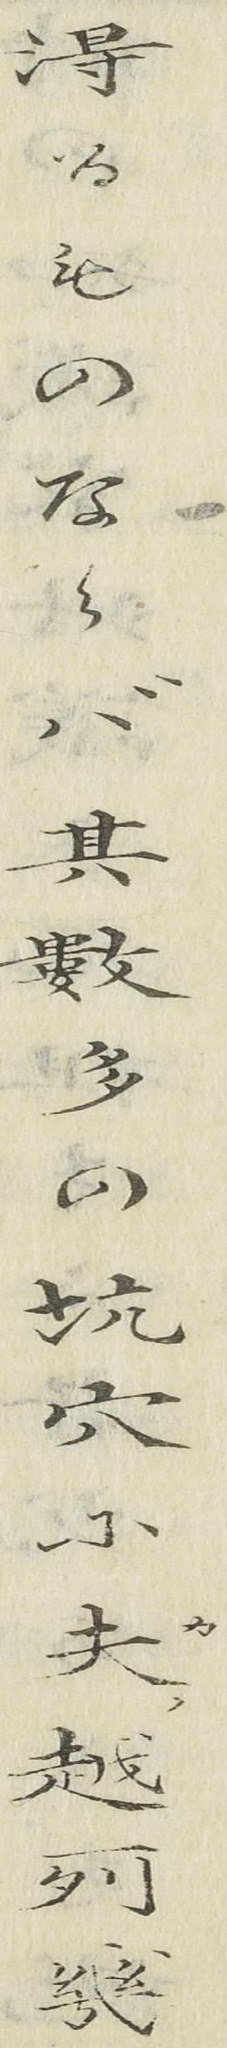得るものならば其数多の坑穴に夫越列幾
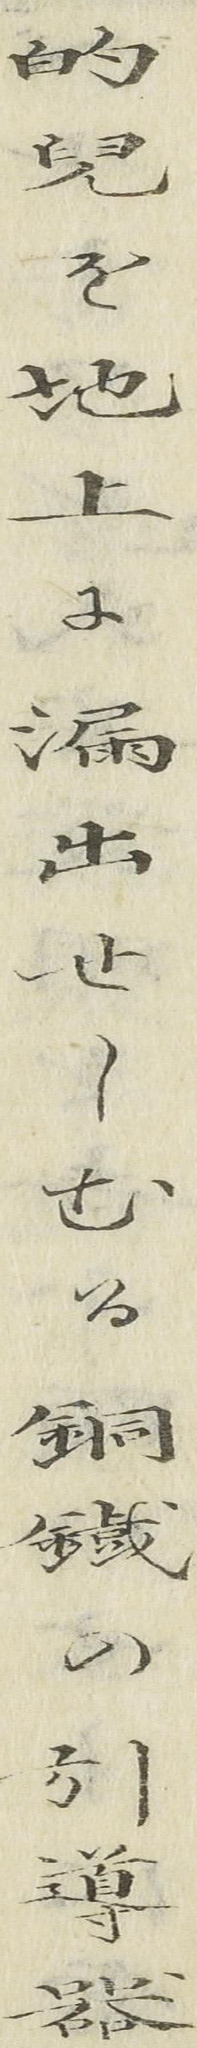的児を地上に漏出せしむる銅鉄の引導器
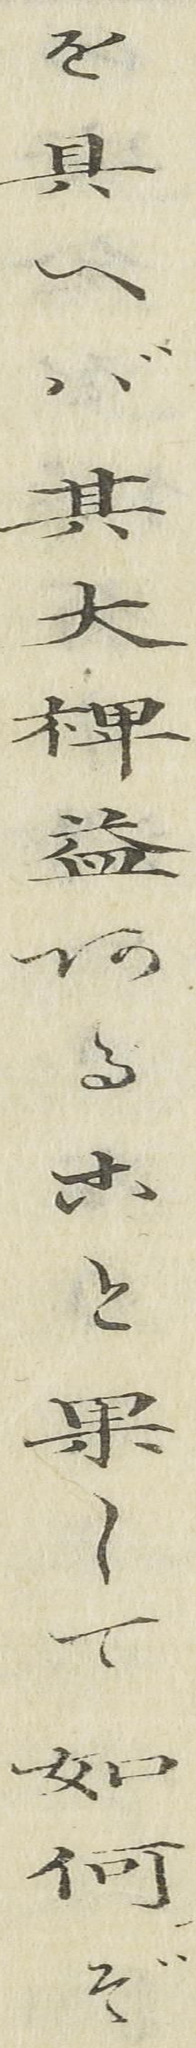を具へば其大裨益あること果して如何ぞ
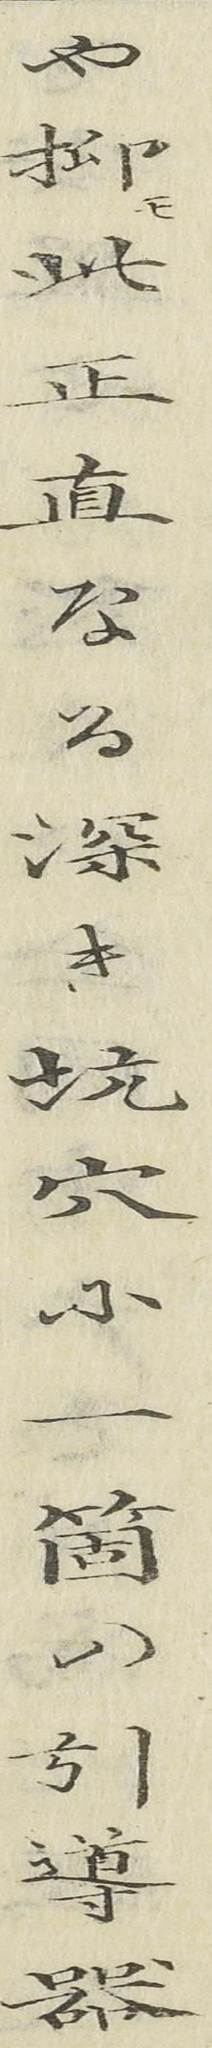や抑此正直なる深き坑穴に一箇の引導器

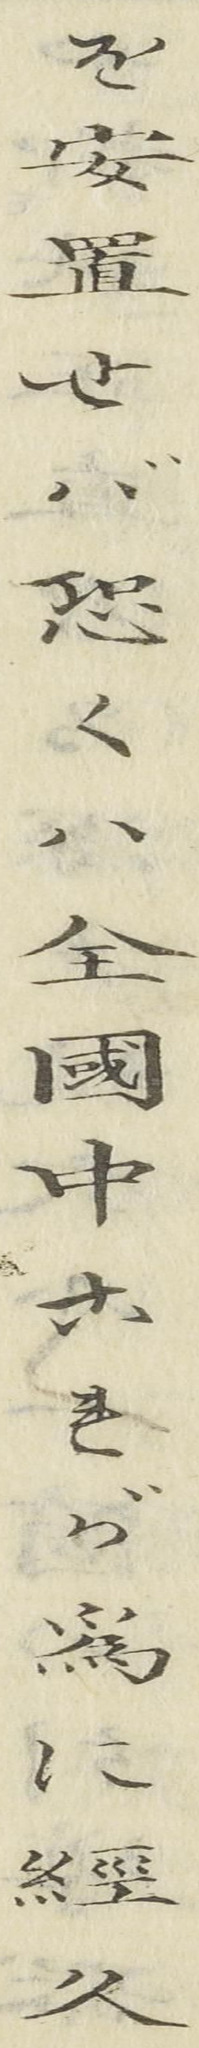を安置せば恐くは全国中これが為に経久
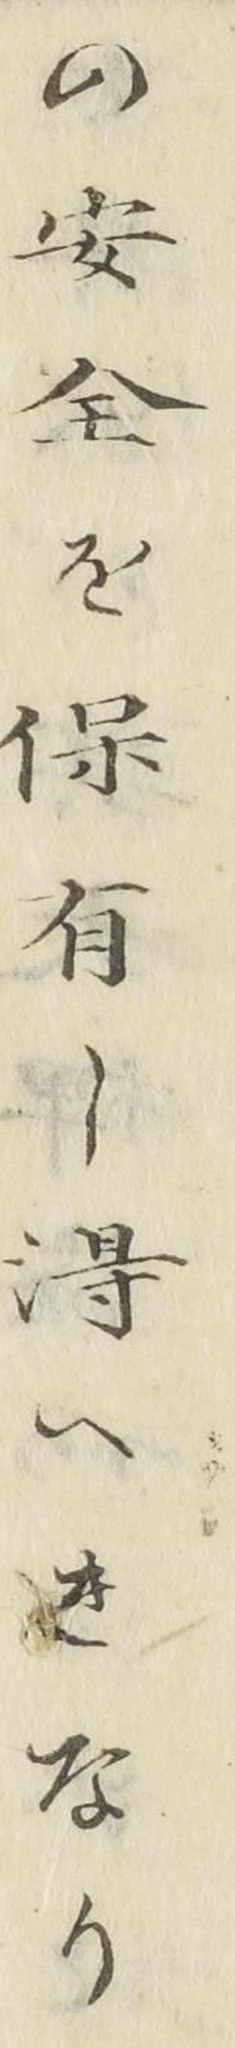の安全を保有し得へきなり
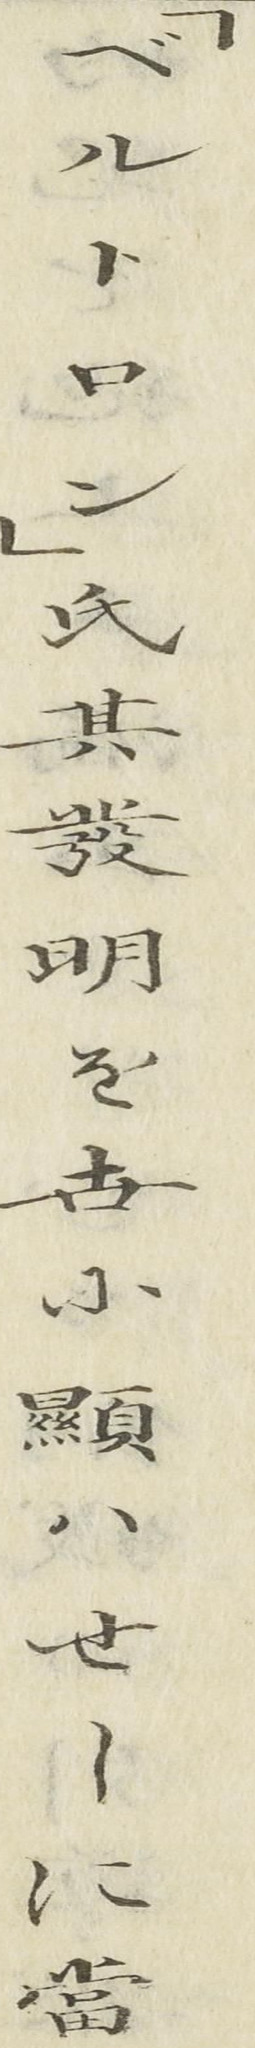「ベルトロン」氏其発明を世に顕はせしに当
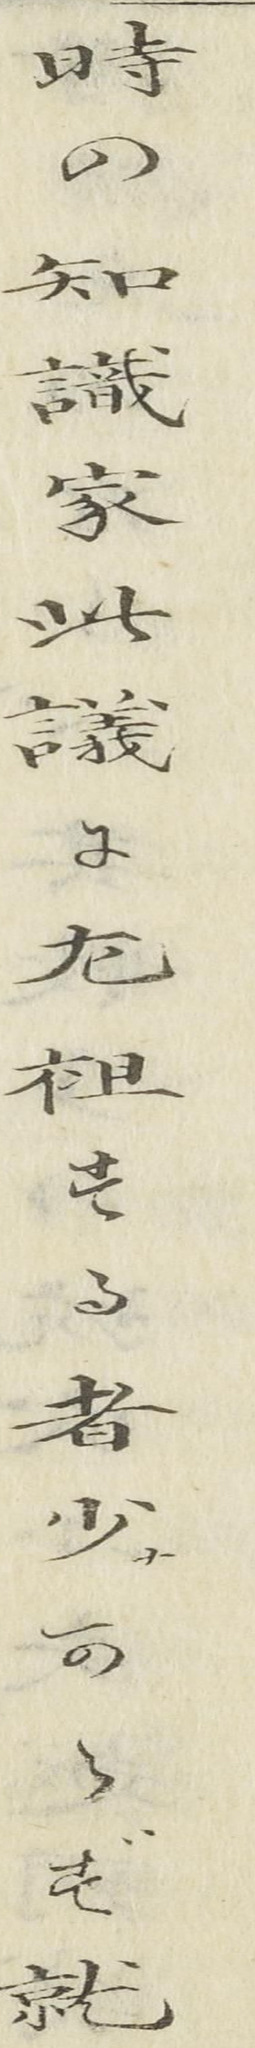時の知識家此議に左袒する者少就
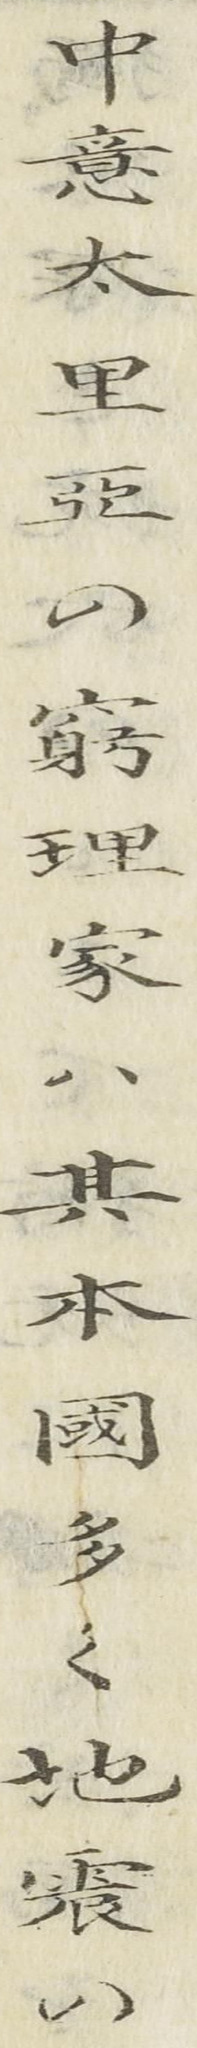中意太里亜の窮理家は其本国多く地震の
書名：地震預防説
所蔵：東京大学地震研究所図書室 Earthquake Research Institute Library, The University of Tokyo, JAPAN
